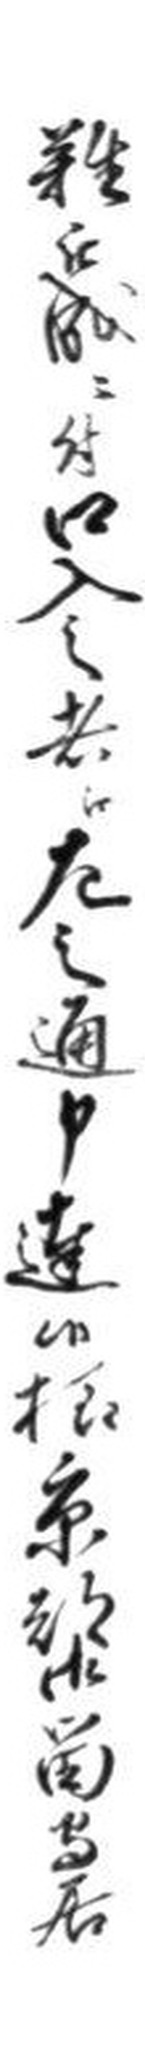難被成ニ付口入之者共江左之通申達候様京都御留守居
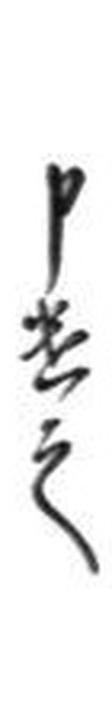申遣之
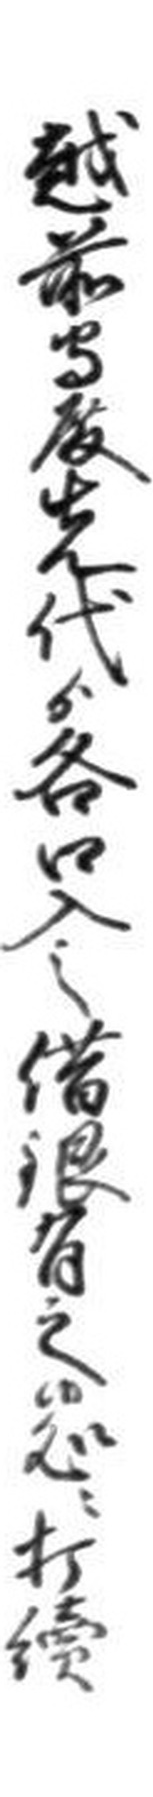越前守殿先代ゟ各口入之借銀有之候処ニ打続
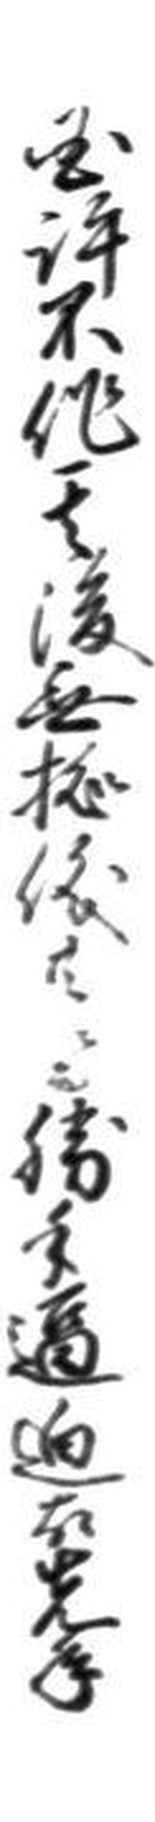国許不作其後無拠儀共ニも勝手逼迫故先手
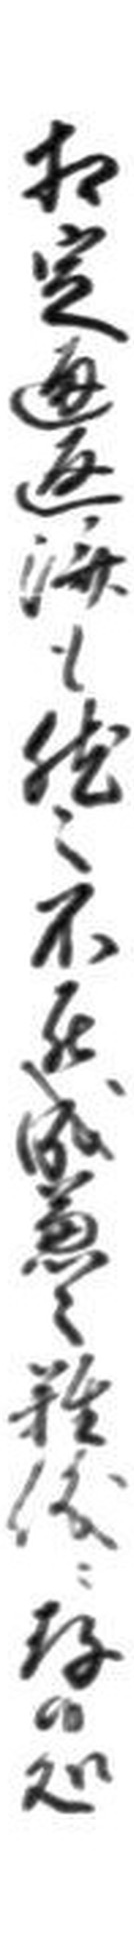相定通返済も然々不被成兼々難儀ニ存候処
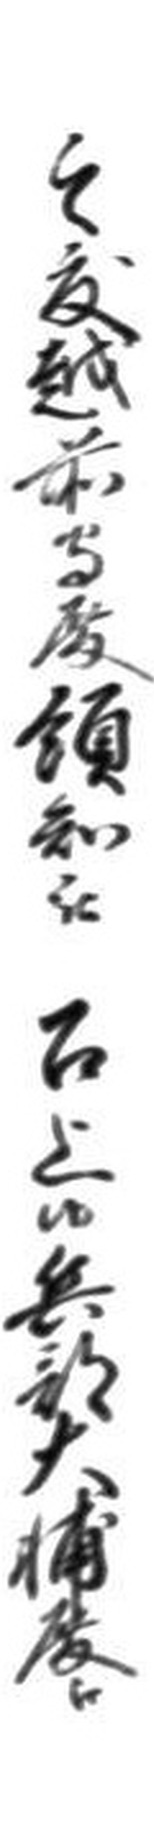今度越前守殿領知被召上候兵部大輔殿江
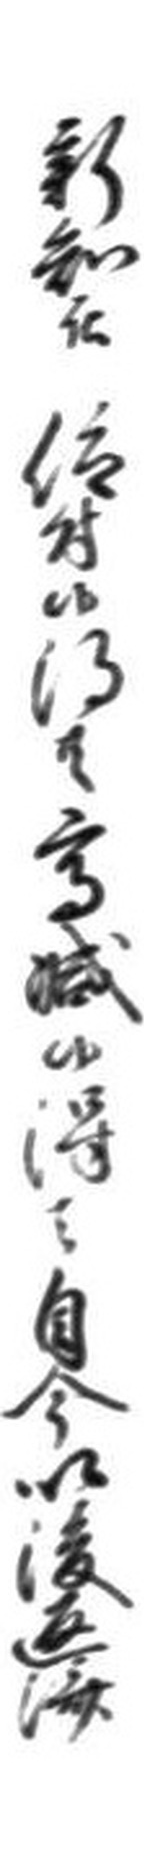新知被仰付候得共高減候得者自今以後返済
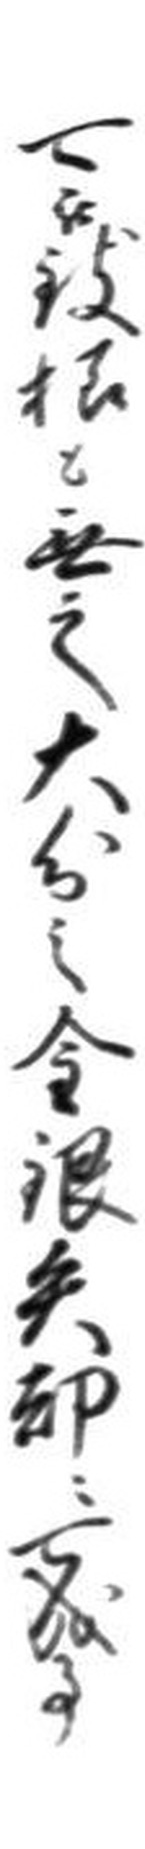可被致様も無之大分之金銀失却二可成事
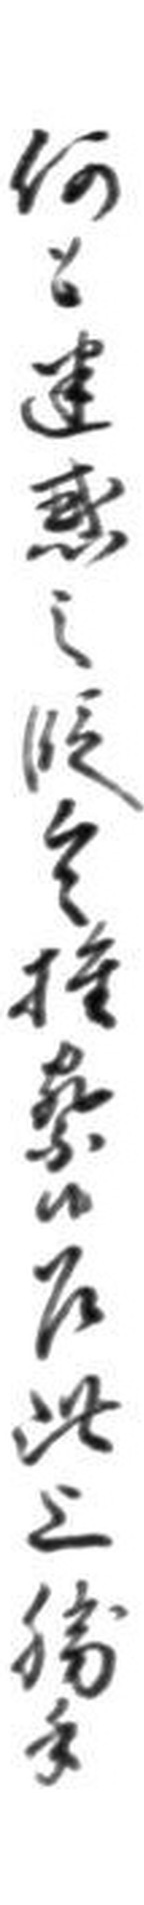何と迷惑之段令推察候乍此上勝手
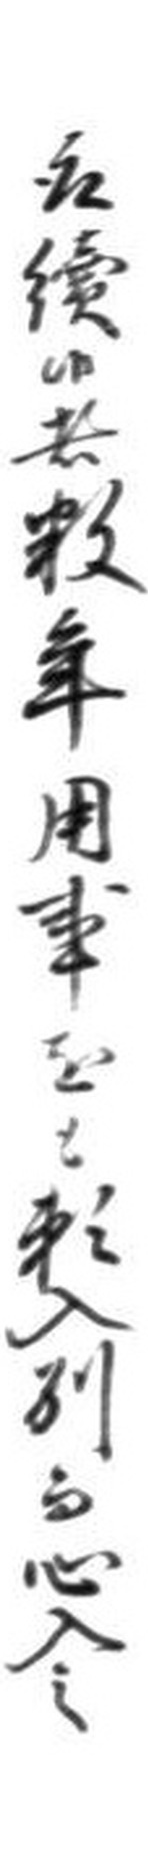取続候者数年用事をも頼入別而心入之

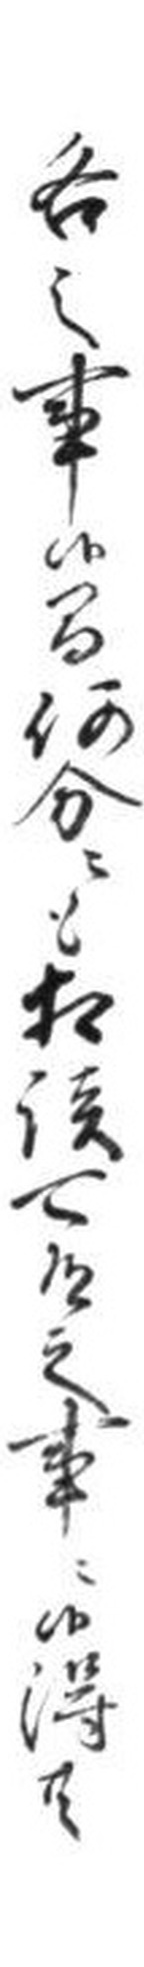各之事候間何分ニも相談可有之事ニ候得共
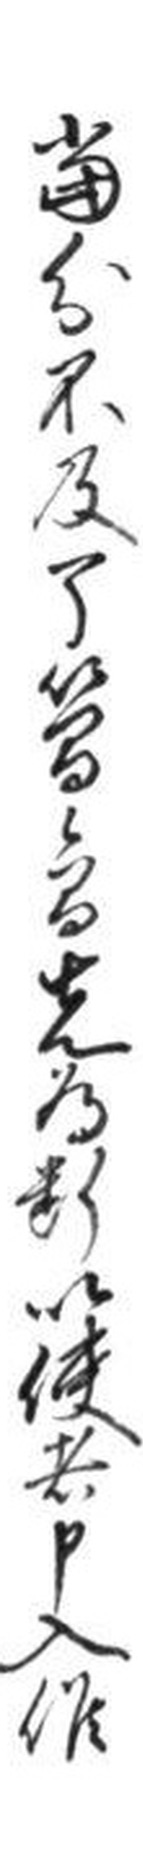当分不及了簡候間先為断以使者申入作
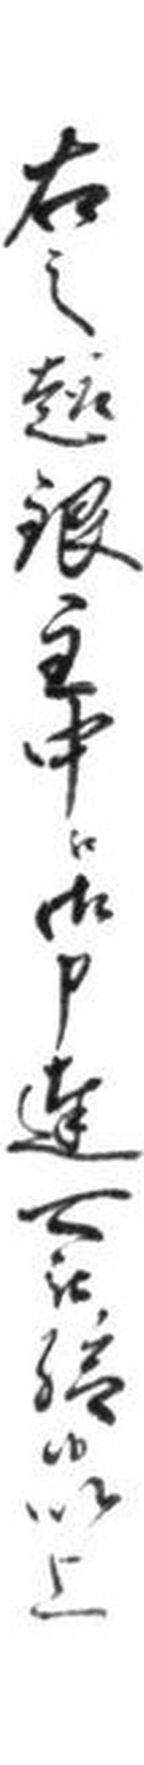右之趣銀主中江御申達可被給候以上
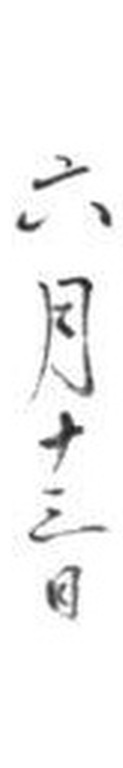六月十三日
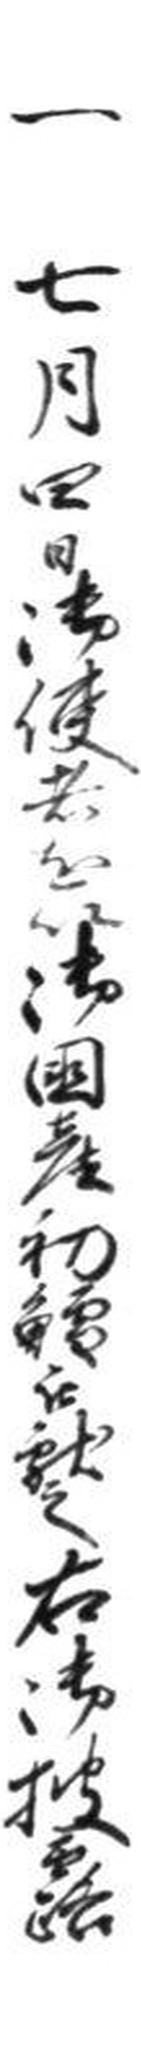一七月四日御使者を以御国産初鱈被献之右御披露
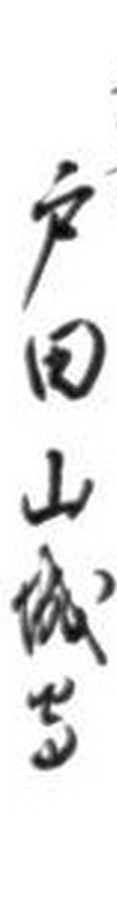戸田山城守
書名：家譜 十六 吉品公 従貞享三年閏三月到同四年
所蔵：福井県文書館 Fukui Prefectural Archives
